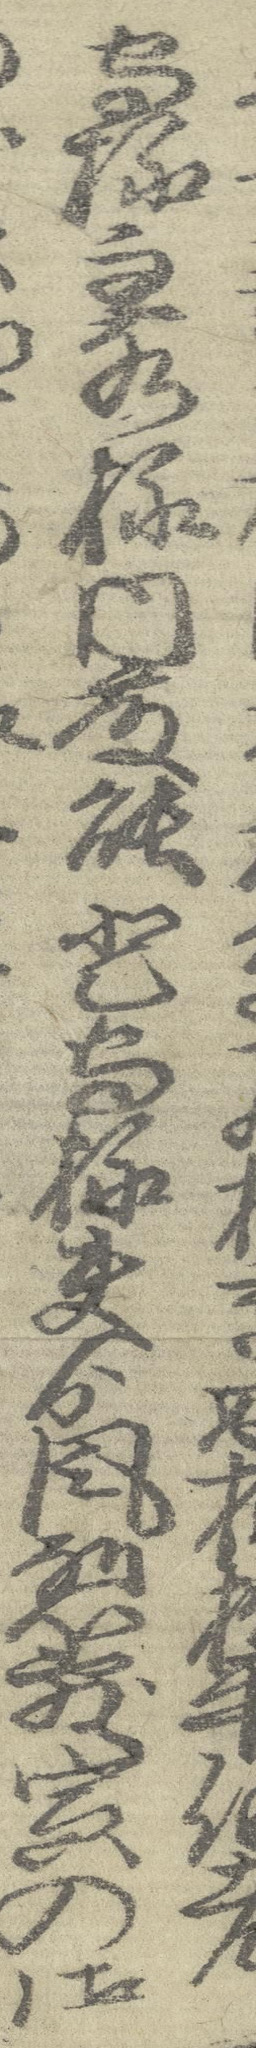守様主水様内藤能登守様夫ゟ風烈敷寅の御
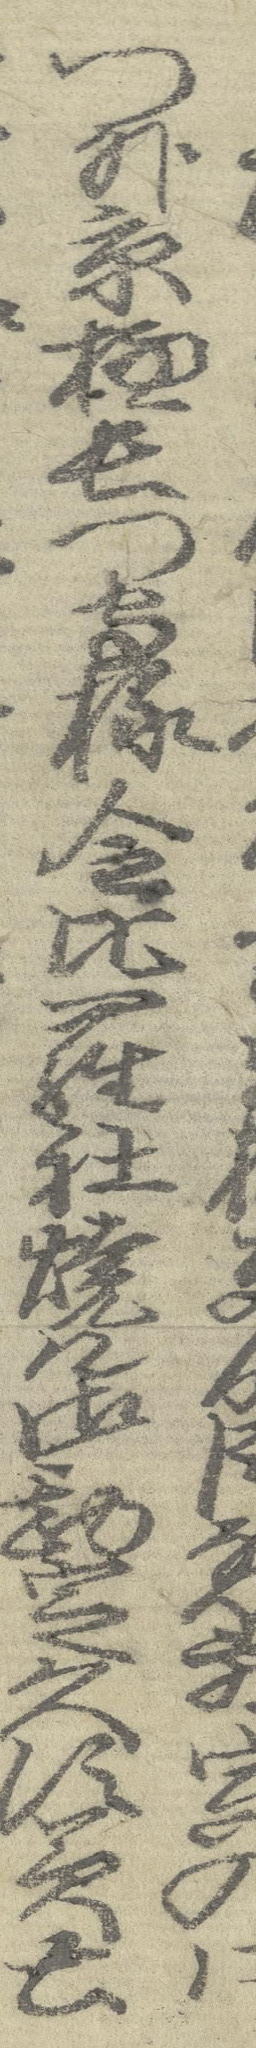門外京極長門守様金比羅社焼ける御勘定久須美土
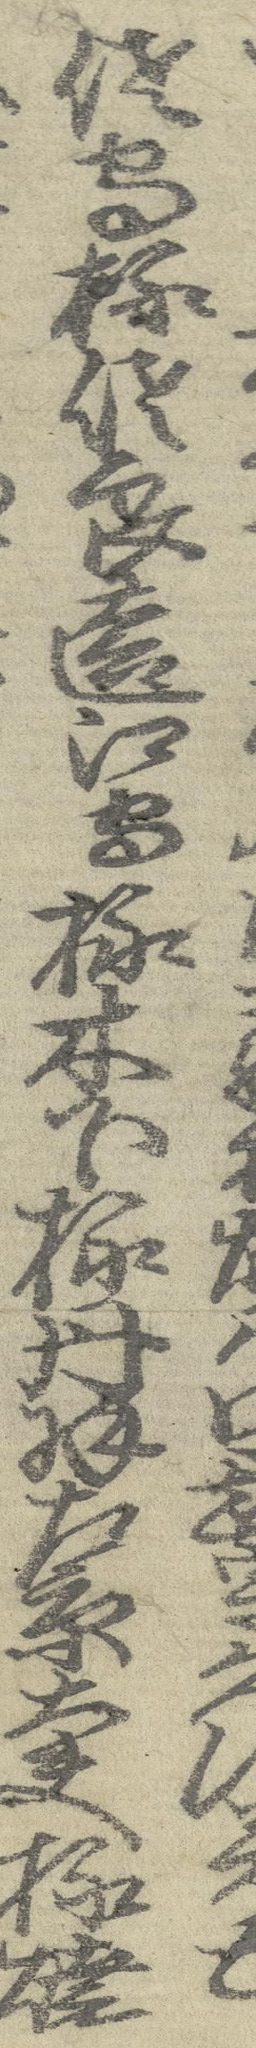佐守様佐良遠江守様木下様丹羽右京太夫様焼
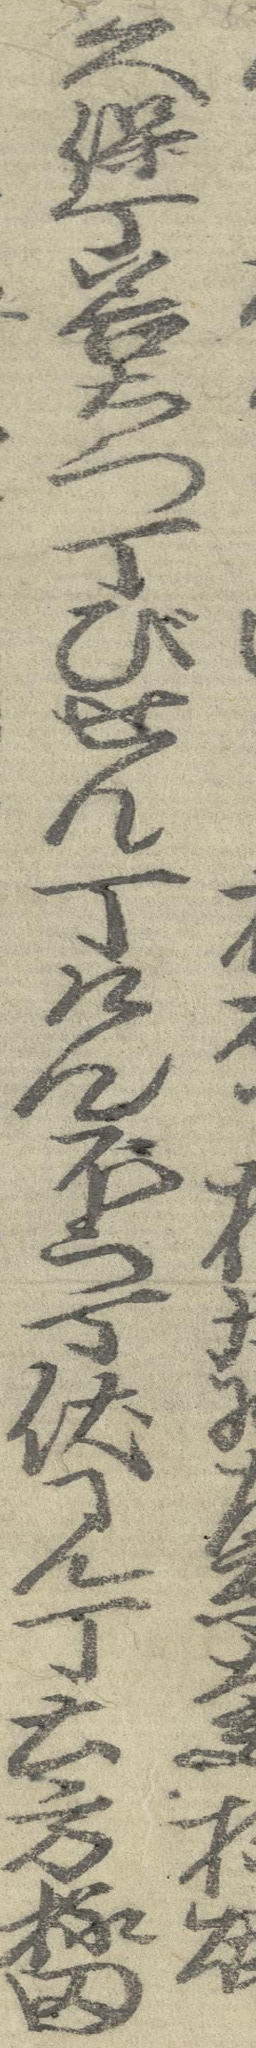久保丁善右衛門丁びせん丁けんぼう丁伏見丁土方様田
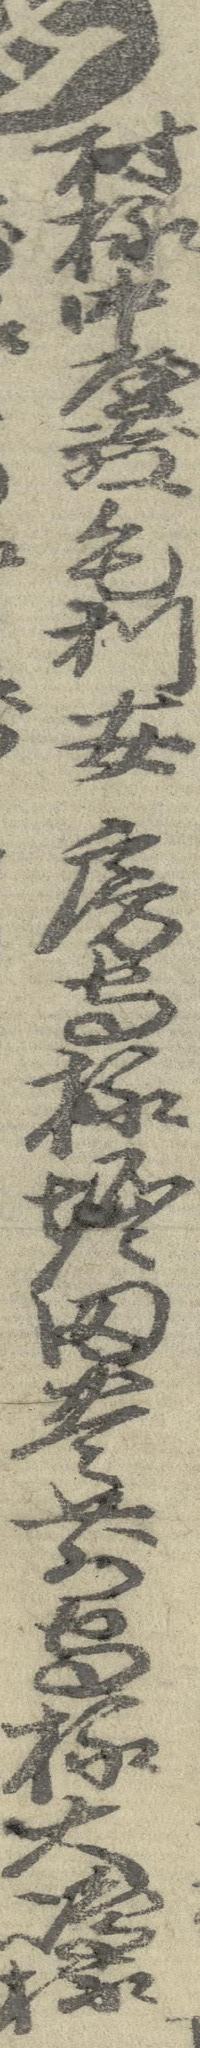村様中屋敷毛利安房守様堀田豊前守様大嶋様
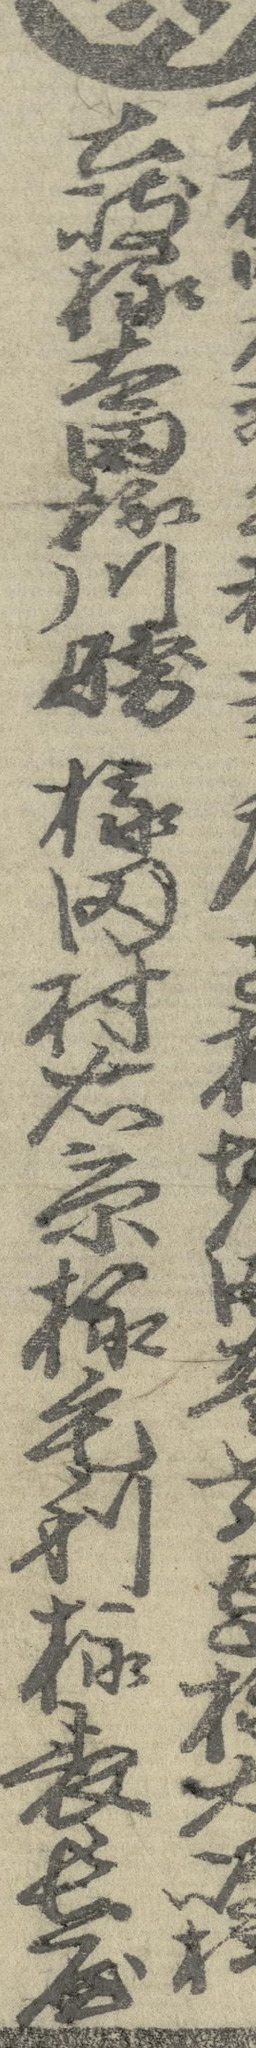土岐様太田様川勝様田村右京様毛利様表長屋
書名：[嘉永三年二月の江戸大火に関する瓦版]
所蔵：東京大学地震研究所図書室 Earthquake Research Institute Library, The University of Tokyo, JAPAN
